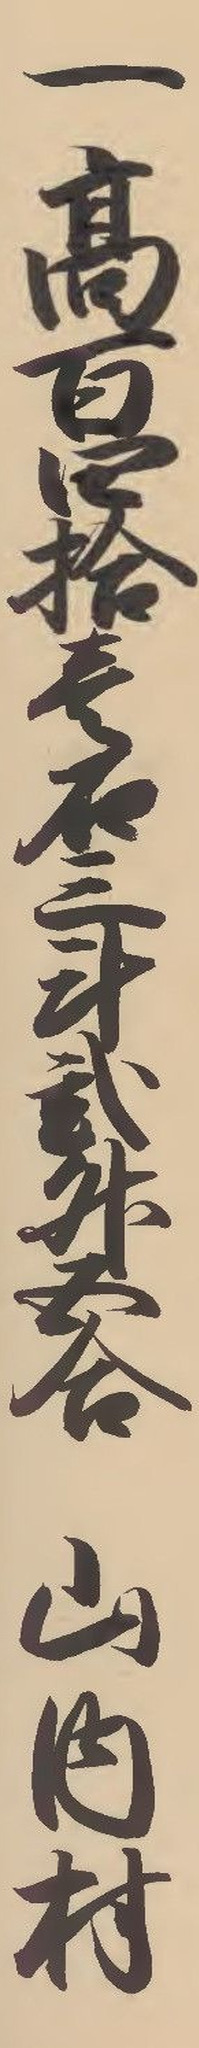一高百四拾壱石三斗弐升五合山内村
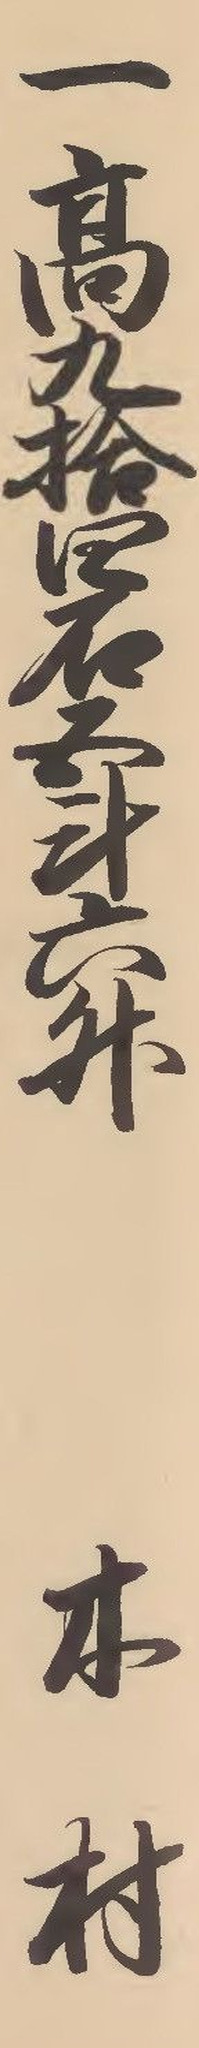一高九拾四石五斗六升木村
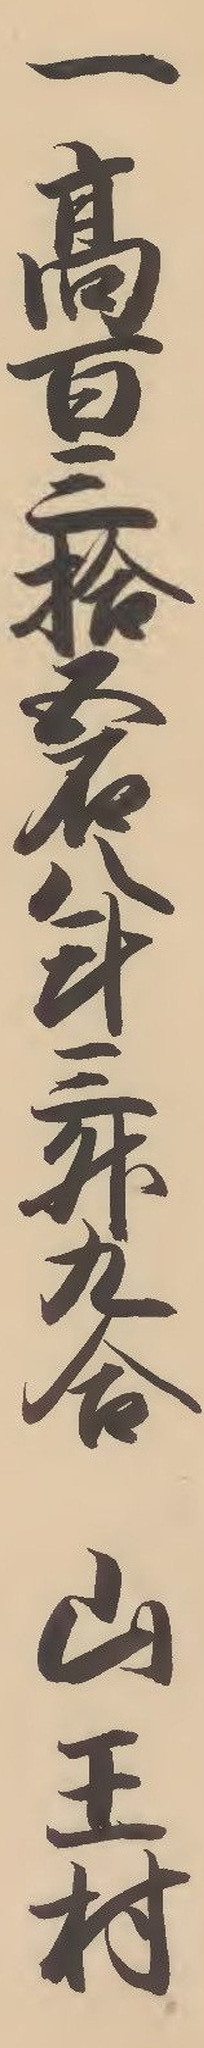一高百三拾五石八斗三升九合山王村
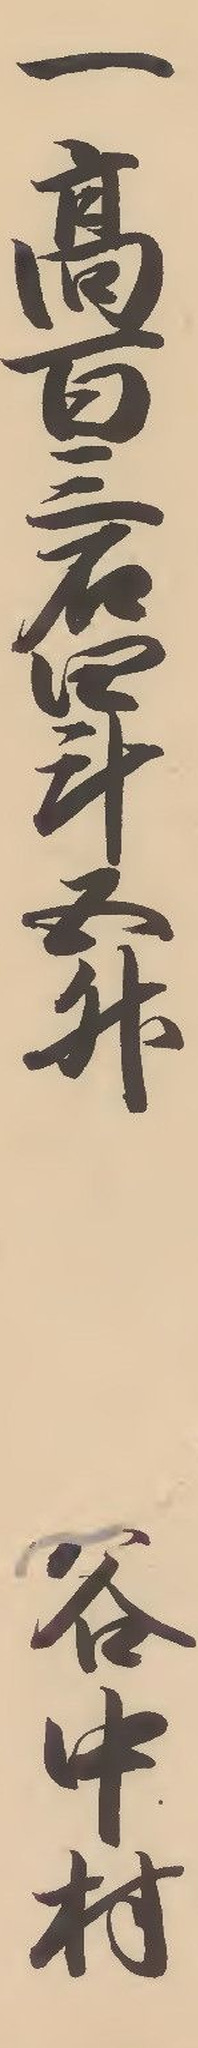一高百三石四斗五升谷中村

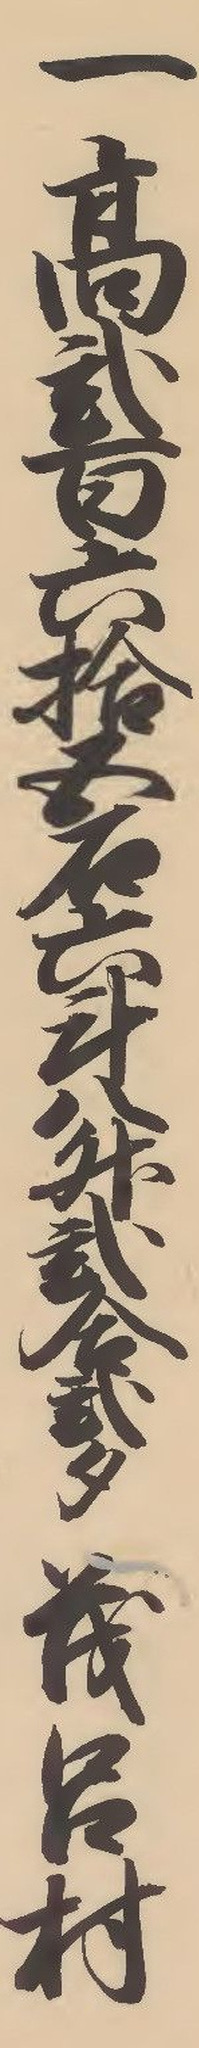一高弐百六拾五石六斗八升弐合弐勺茂呂村
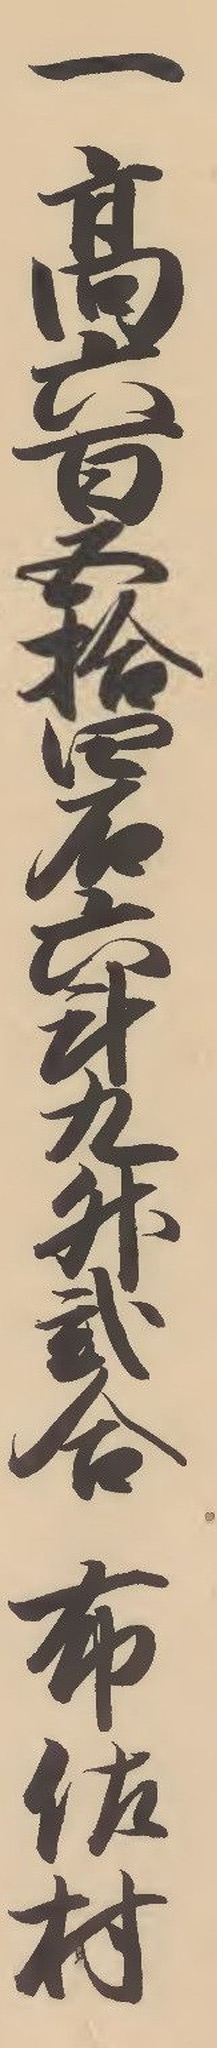一高六百五拾四石六斗九升弐合布佐村
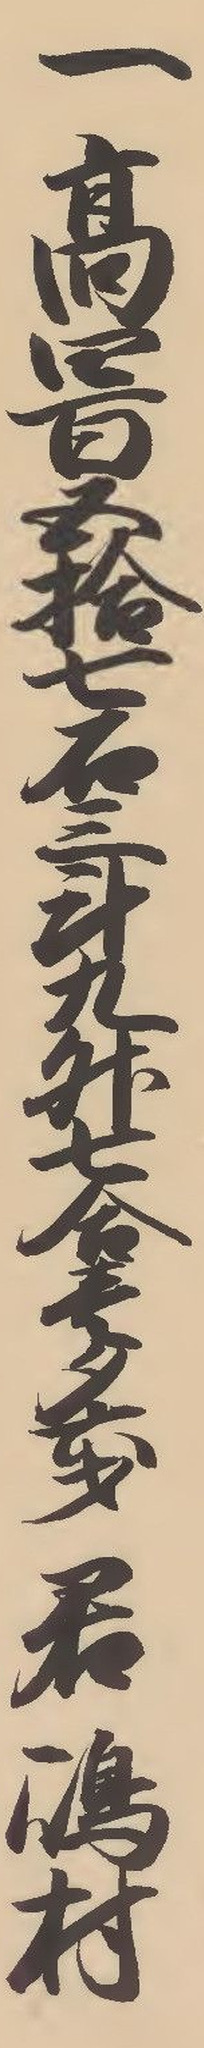一高四百五拾七石三斗九升七合壱勺六才君島村
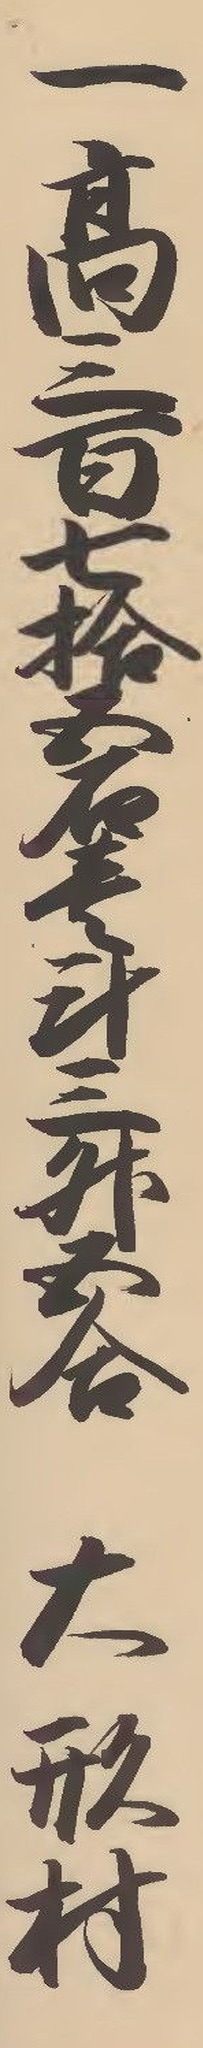一高三百七拾五石壱斗三升五合大形村
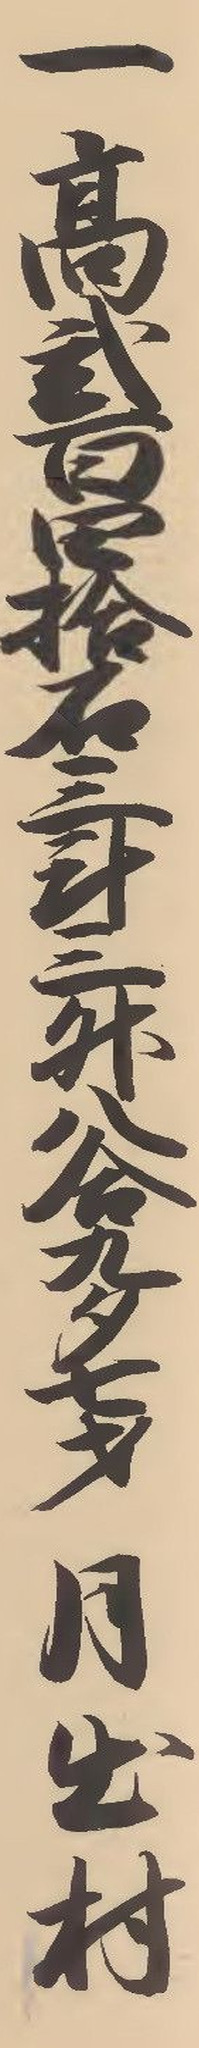一高弐百四拾石三斗三升八合九勺七才月出村
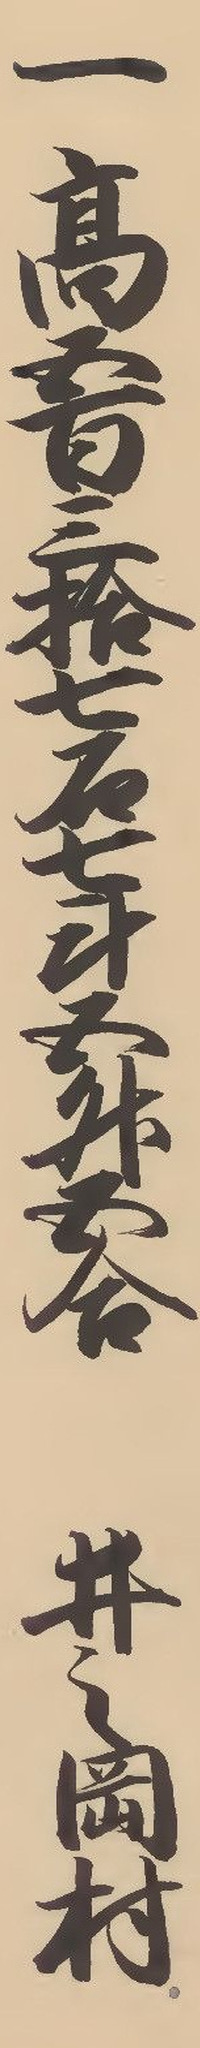一高五百三拾七石七斗五升五合井之岡村
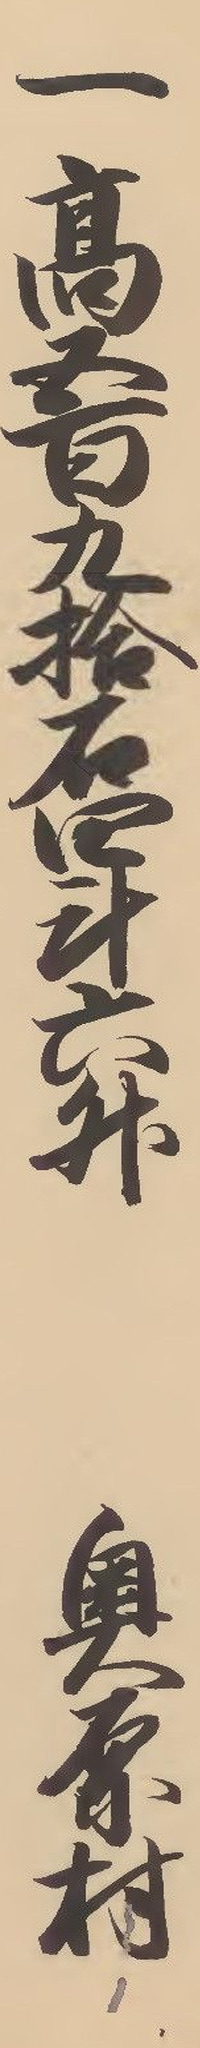一高五百九拾石四斗六升奥原村
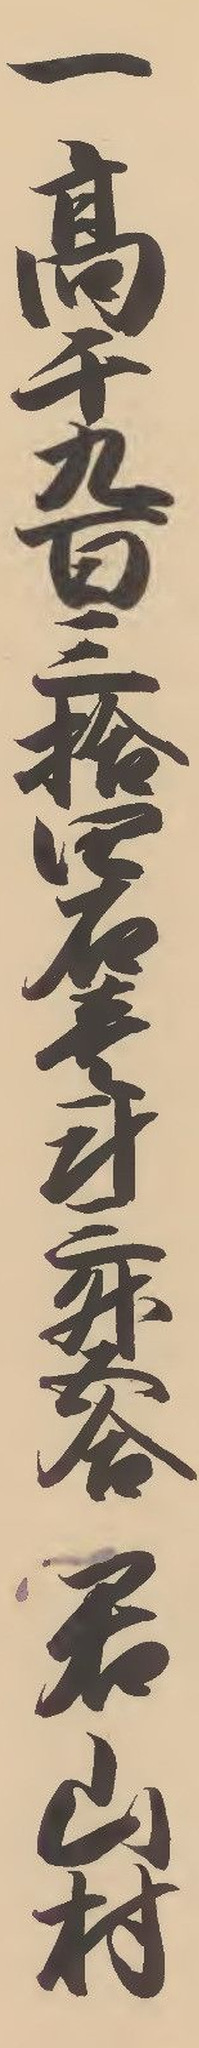一高千九百三拾四石壱斗三升五合君山村

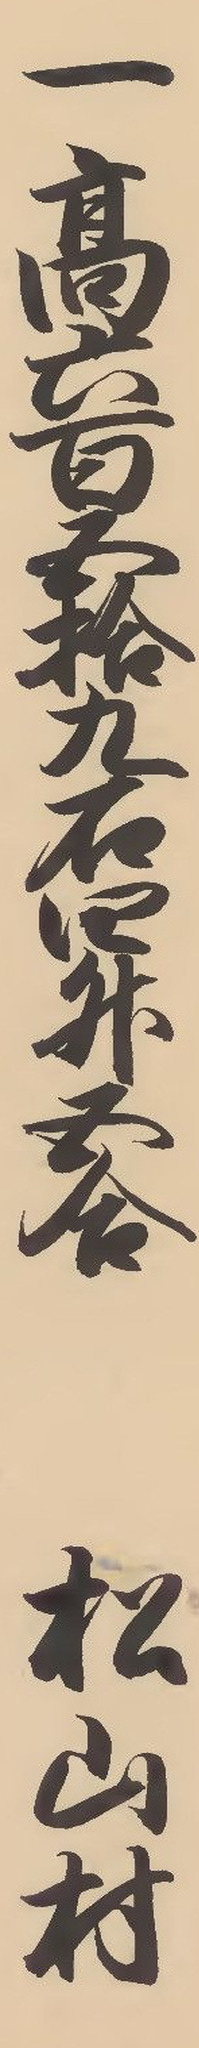一高六百五拾九石四升五合松山村
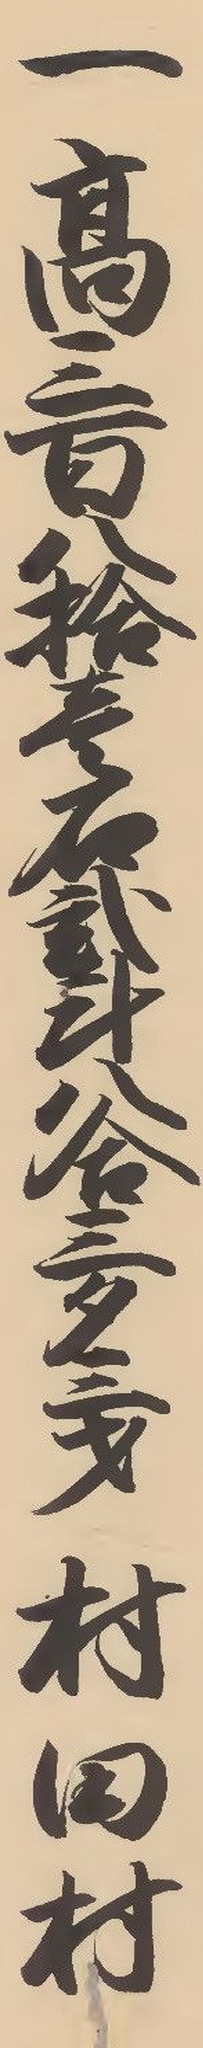一高三百八拾壱石弐斗八合三タ三才村田村
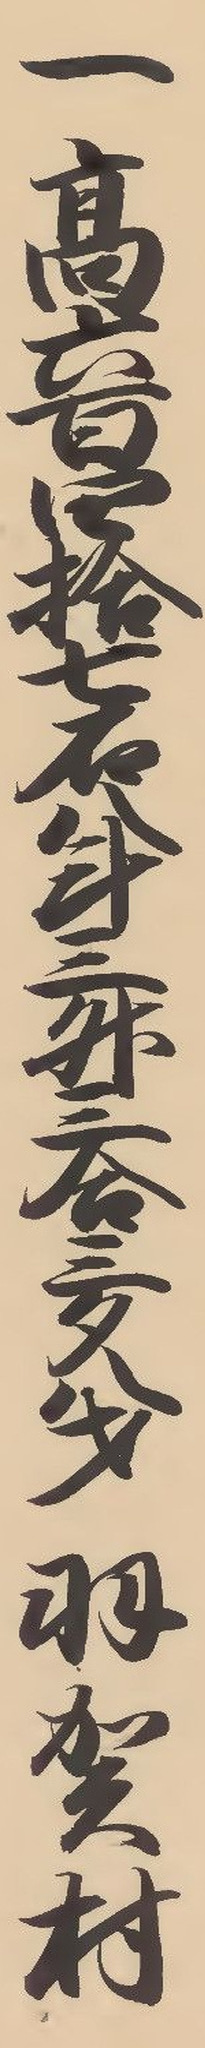一高六百四拾七石八斗三升三合三勺八才羽賀村
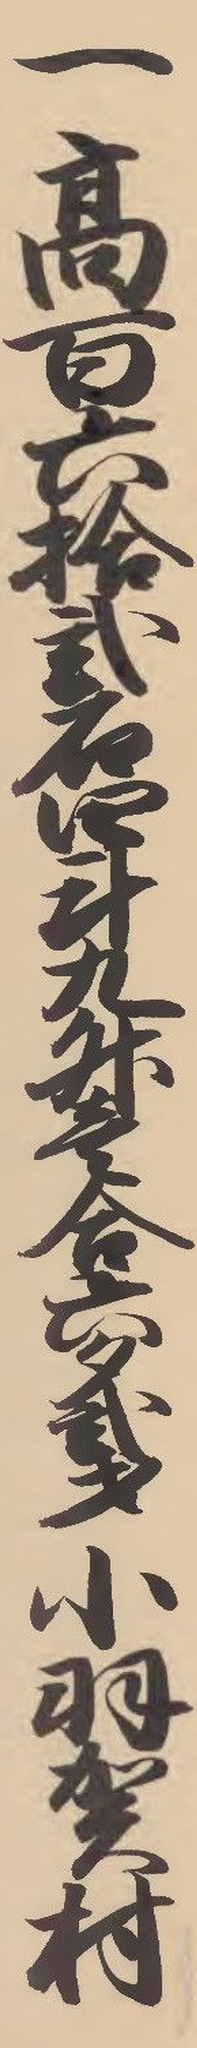一高百六拾弐石四斗九升壱合六勺弐才小羽賀村
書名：常陸国郷帳
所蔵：国立公文書館 National Archives of Japan
